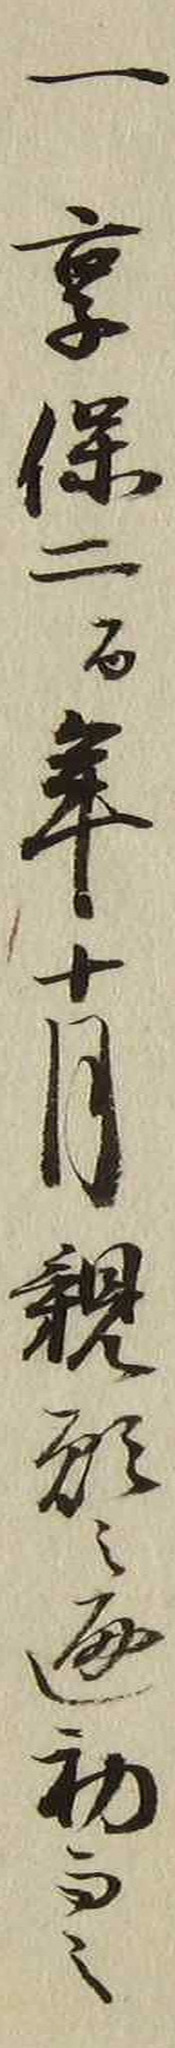一享保二酉年十月親願之通初而之
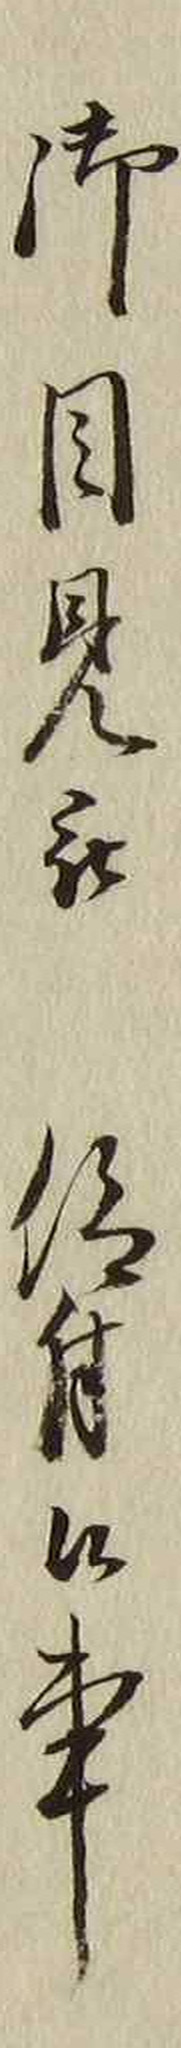御目見被仰付候事
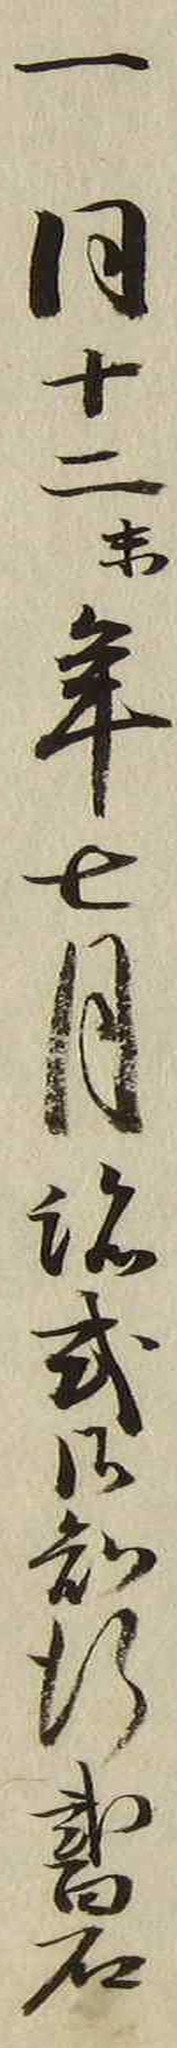一同十二未年七月跡式御知行弐百石
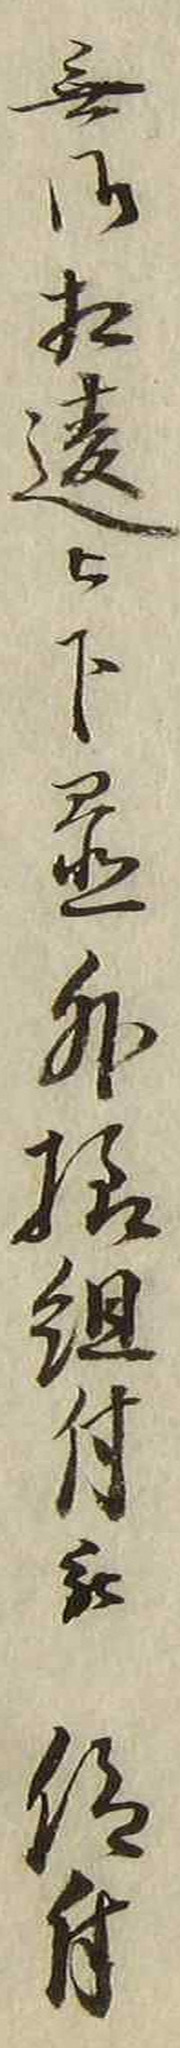無御相違被下置外様組付被仰付
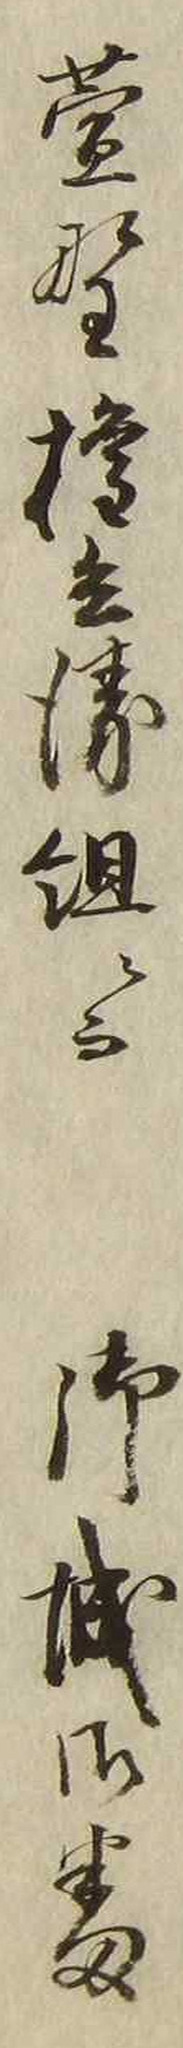萱野権兵衛組ニ而御城御番

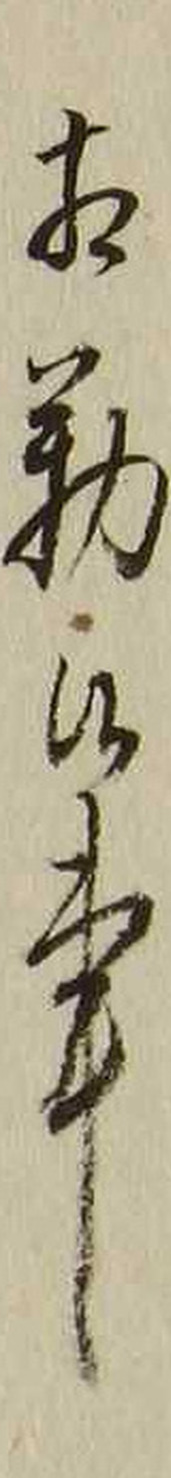相勤候事
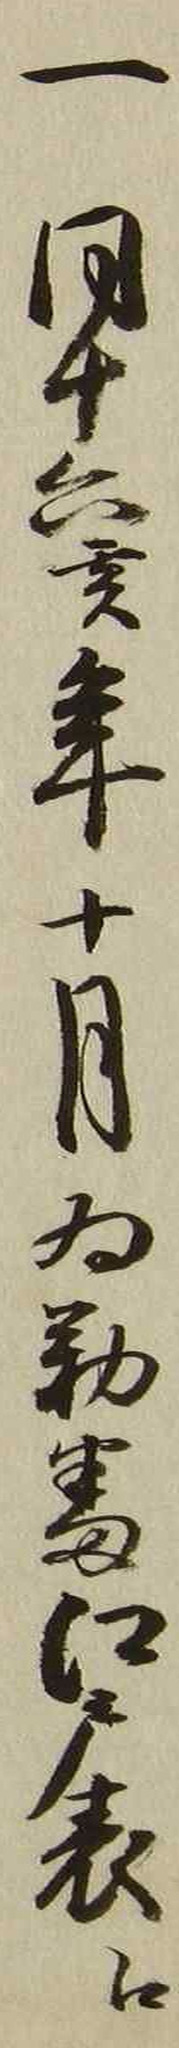一同十六亥年十月為勤番江戸表江
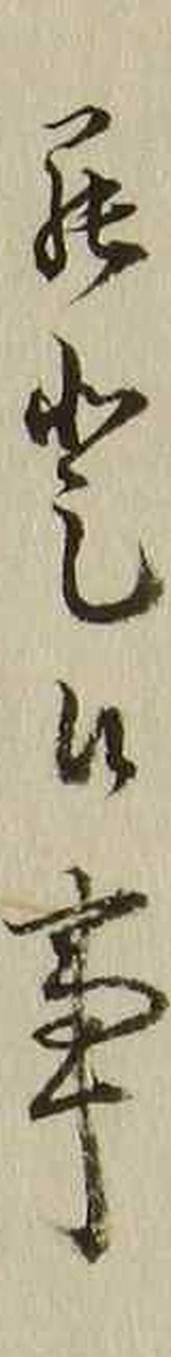罷登候事
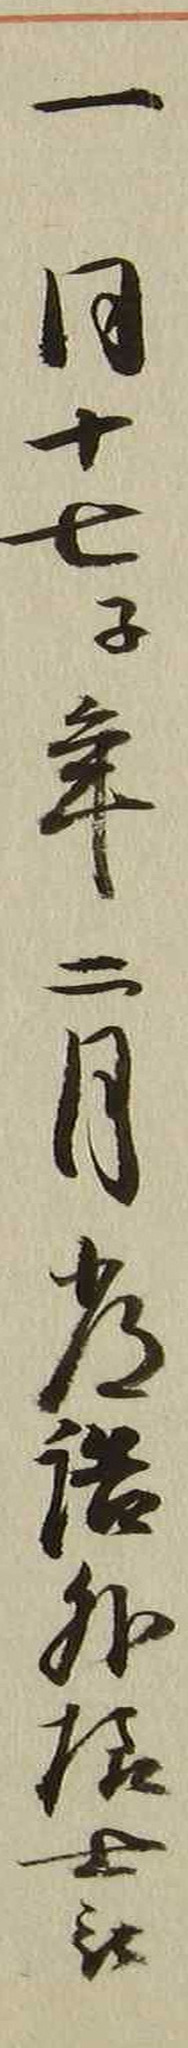一同十七子年二月常詰外様士被
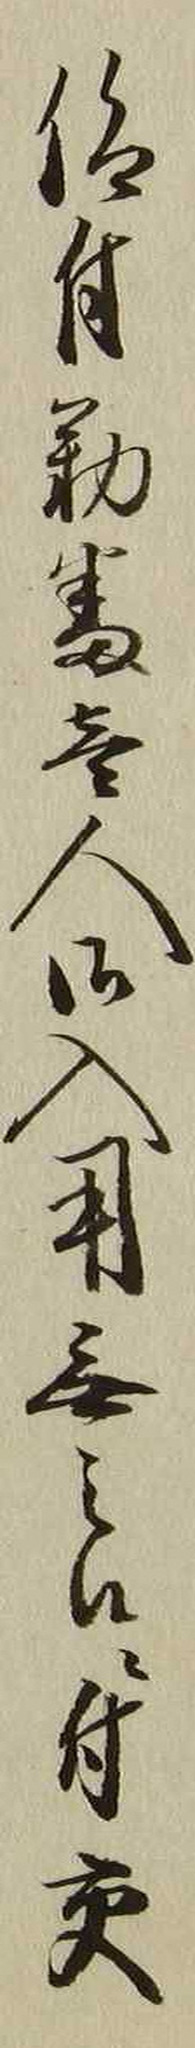仰付勤番壱人御入用無之候ニ付交
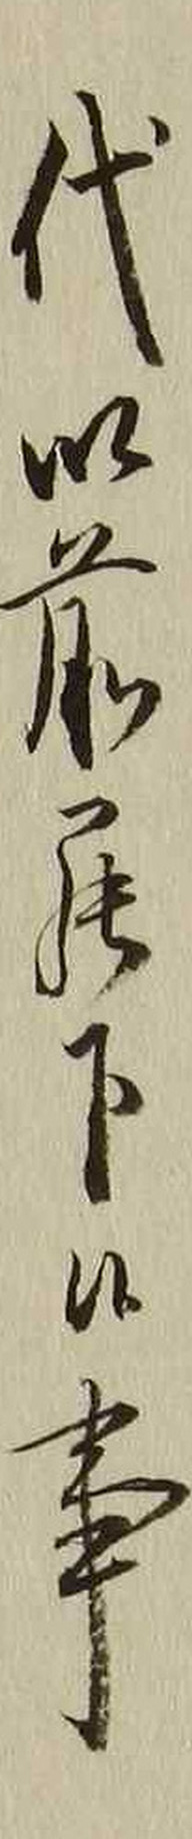代以前罷下候事
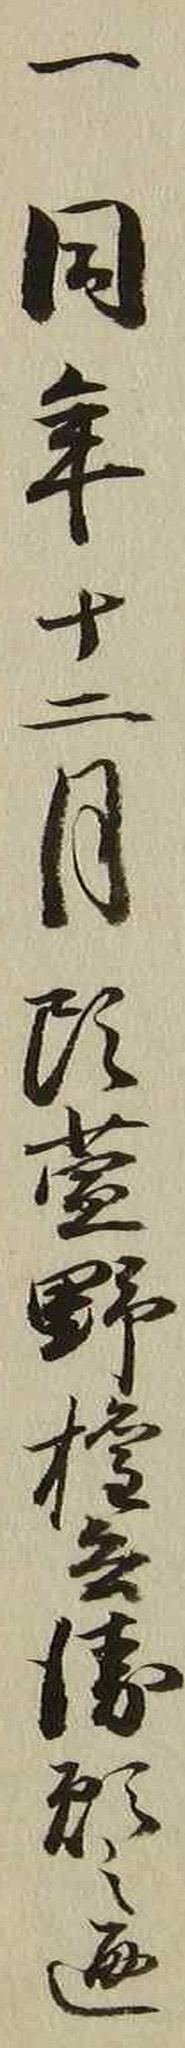一同年十二月頭萱野権兵衛願之通
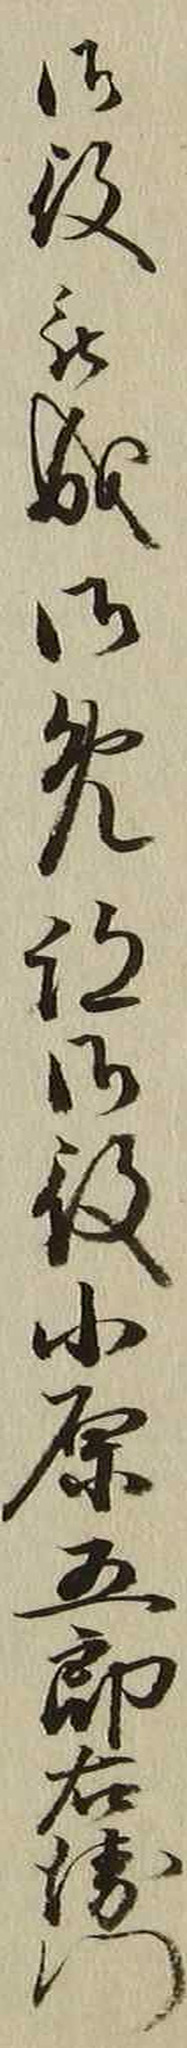御役被成御免跡御役小原五郎右衛門
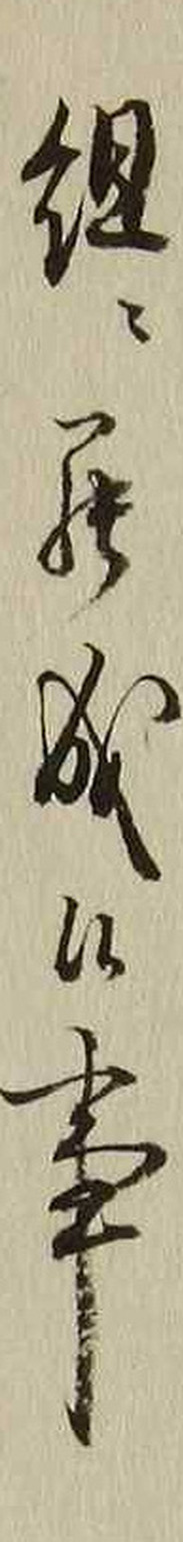組ニ罷成候事
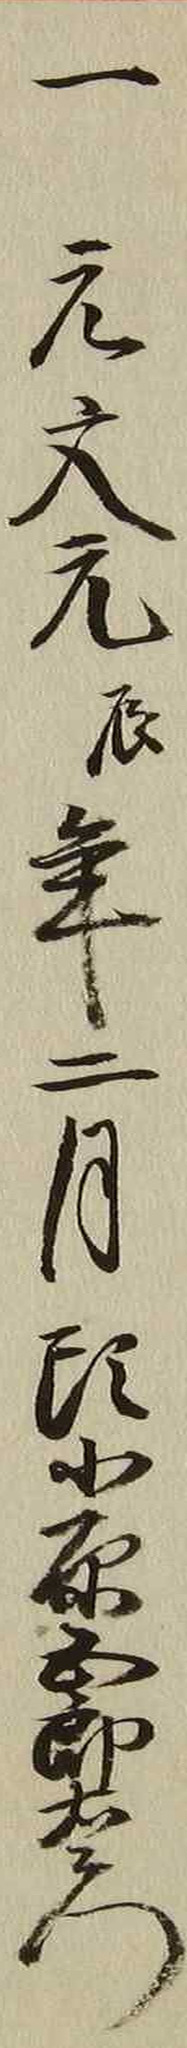一元文元辰年二月頭小原五郎右衛門
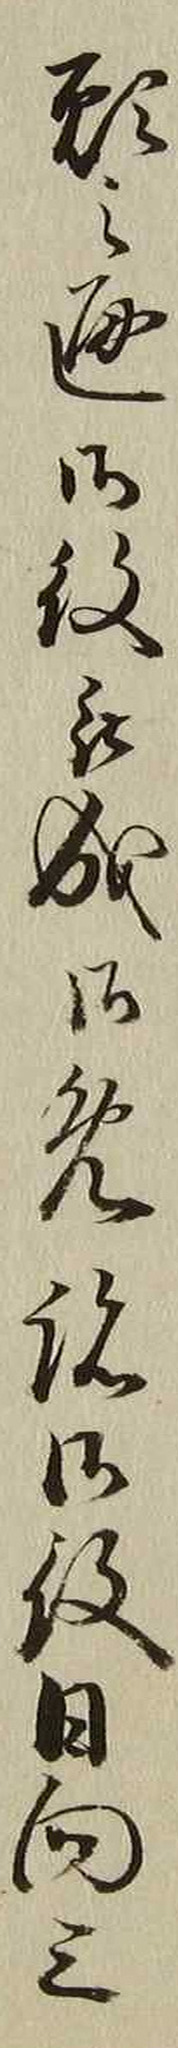願之通御役被成御免跡御役日向三
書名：諸士系譜　巻之69　を之部3
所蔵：会津若松市立会津図書館
